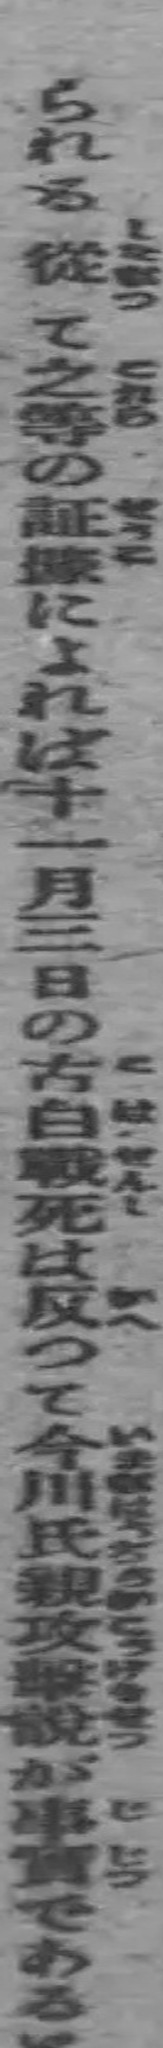られる従て之等の証拠によれば十一月三日の古白戦死は反つて今川氏親攻撃説が事実であると
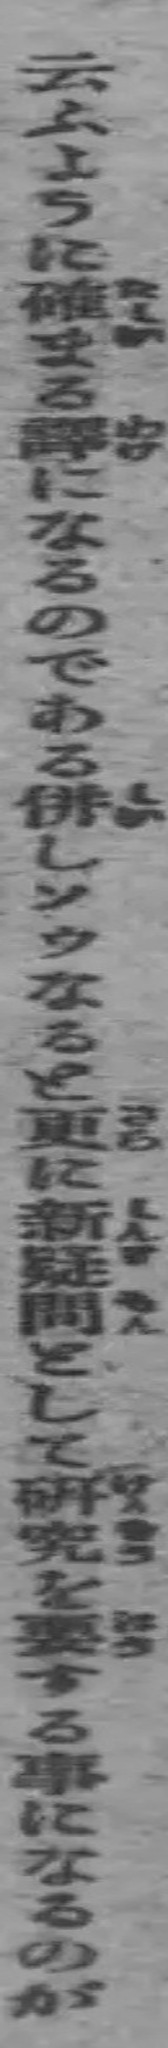云ふように確まる訳になるのである併しソウなると更に新疑問として研究を要する事になるのが
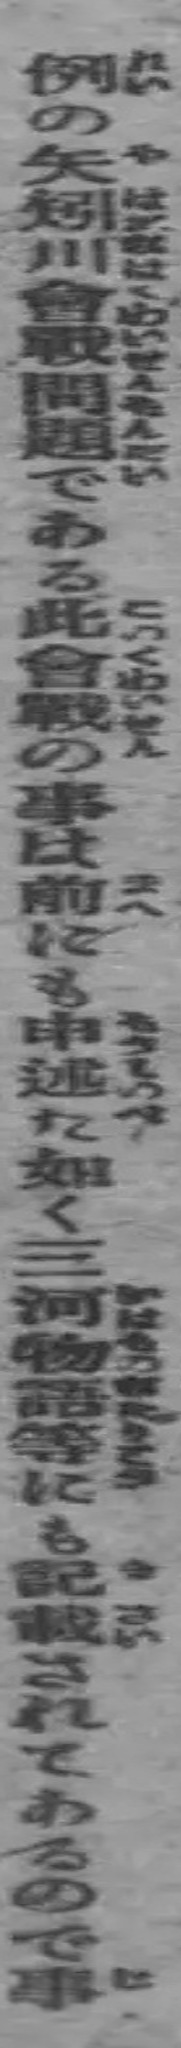例の矢矧川合戦問題である此合戦の事は前にも申述た如く三河物語等にも記載されてあるので事
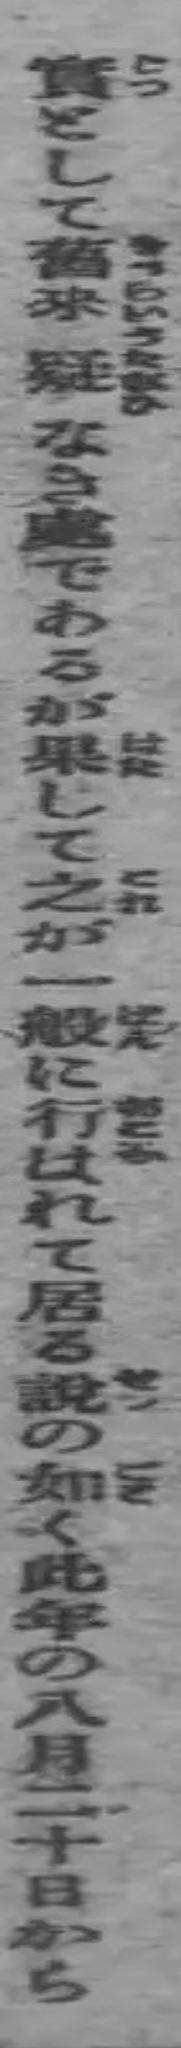実として旧来疑なき処であるが果して之が一般にお行はれて居る説の如く此年の八月二十日から
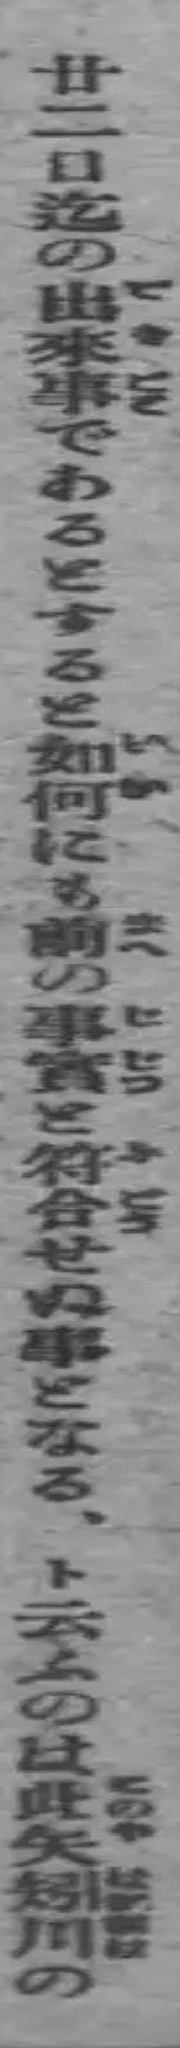廿二日迄の出来事であるとすると如何にも前の事実と符号せぬ事となる、ト云ふのは此矢矧川の
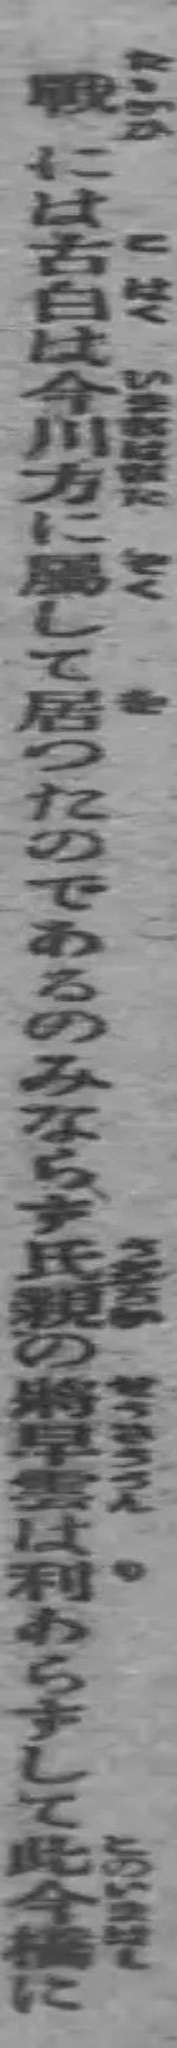戦には古白は今川方に属して居つたのであるのみならず氏親の将早雲は利あらずして此今橋に
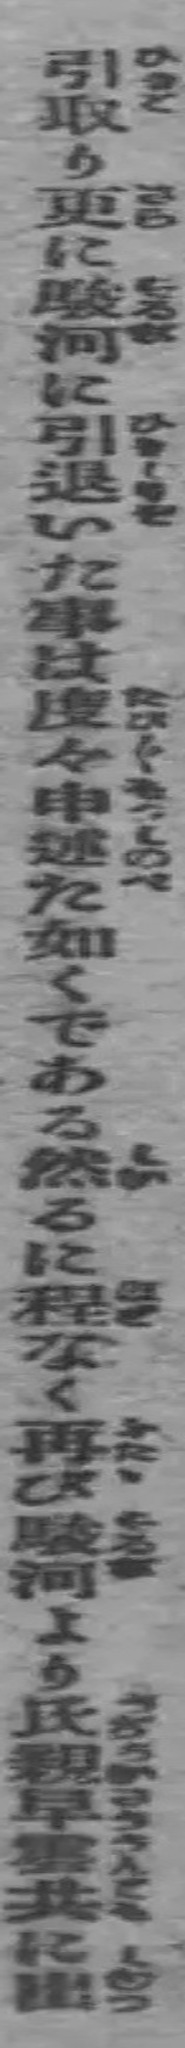引取り更に駿河に引退いた事は度々申述た如くである然るに程なく再び駿河より氏親早雲共に出
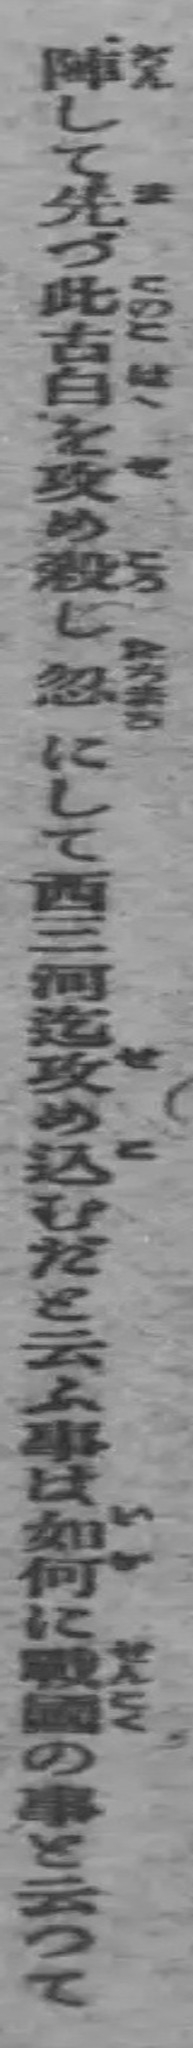陣して先づ此古白を攻め殺し忽にして西三河迄攻め込むだと云ふ事は如何に戦国の事と云つて
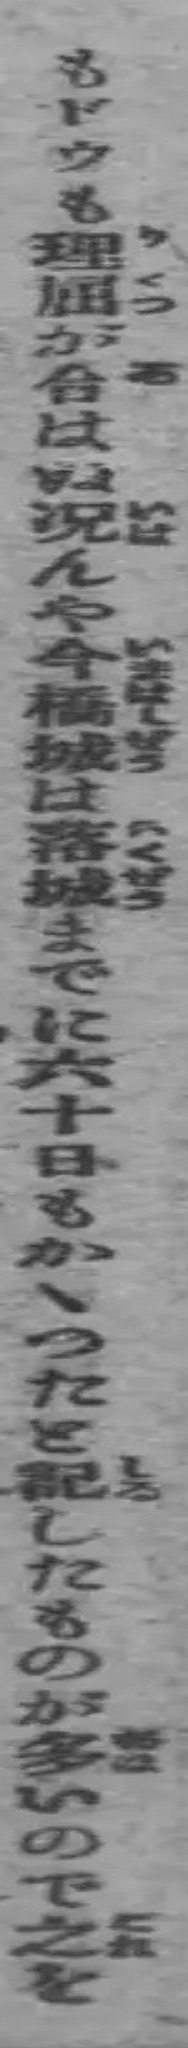もドウも理屈が合はぬ況んや今橋城は落城までに六十日もかゝつたと記したものが多いので之を
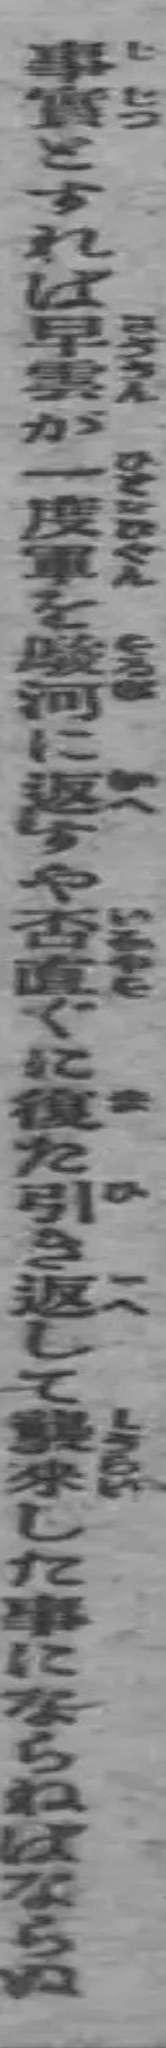事実とすれば早雲が一度軍を駿河に返すや否直ぐに復た引き返して襲来した事にならねばならぬ
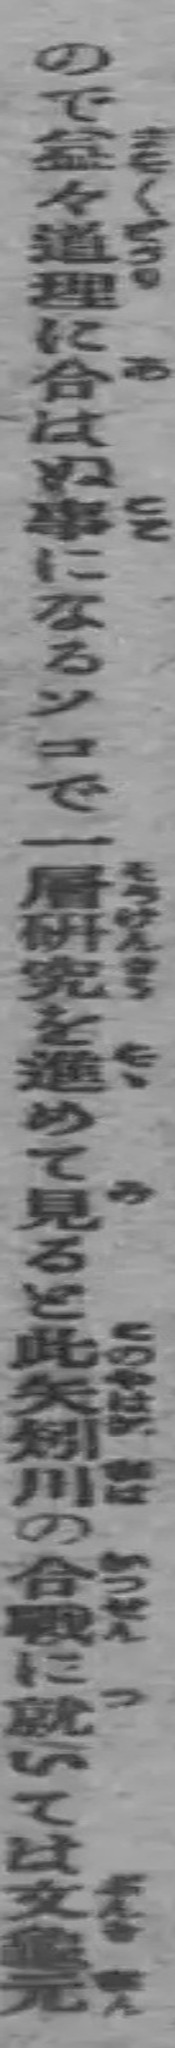ので益々道理に合はぬ事になるソコで一層研究を進めて見ると此矢矧川の合戦に就いては文亀元
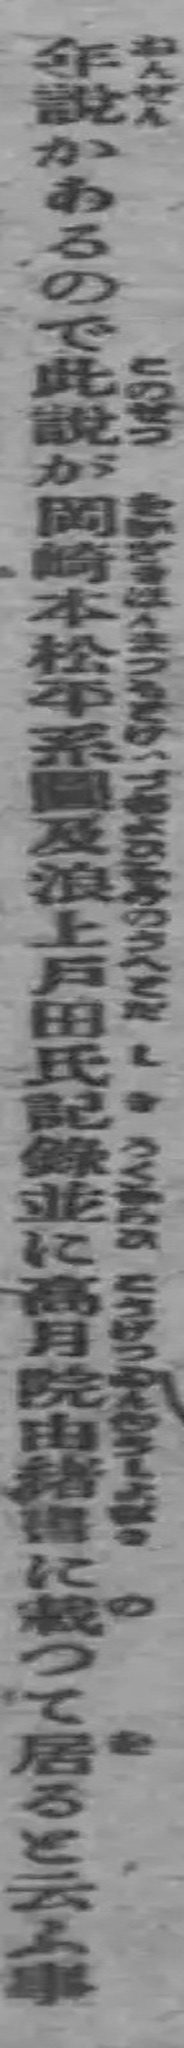年説かあるので此説が岡崎本松平系図及浪上戸田氏記録並に高月院由緒書に載つて居ると云ふ事
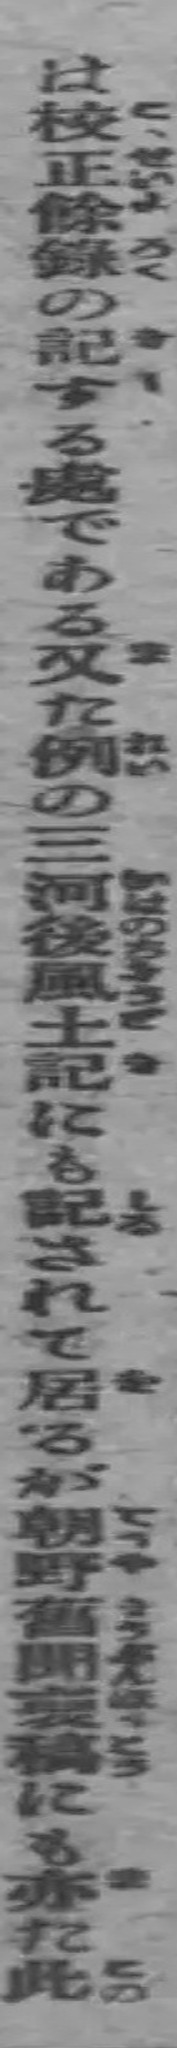は校正余禄の記する処である又た例の三河後風土記にも記されて居るが朝野旧聞裒稿にも亦た此
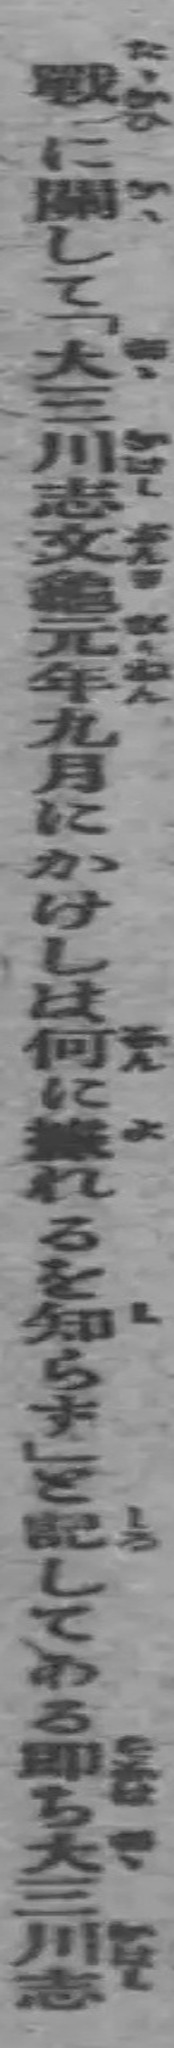戦に関して「大三川志文亀元年九月にかけしは何に拠れるを知らず」と記してある即ち大三川志
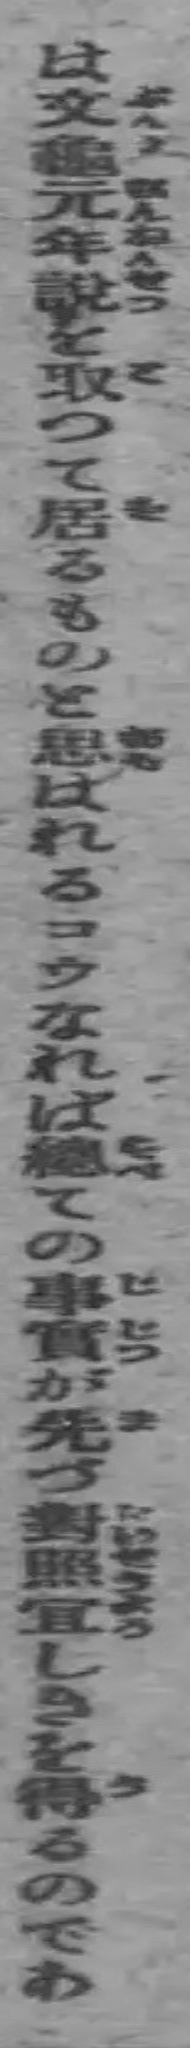は文亀元年説を取つて居るものと思はれるコウなれば総ての事実が先づ対照宜しきを得るのであ

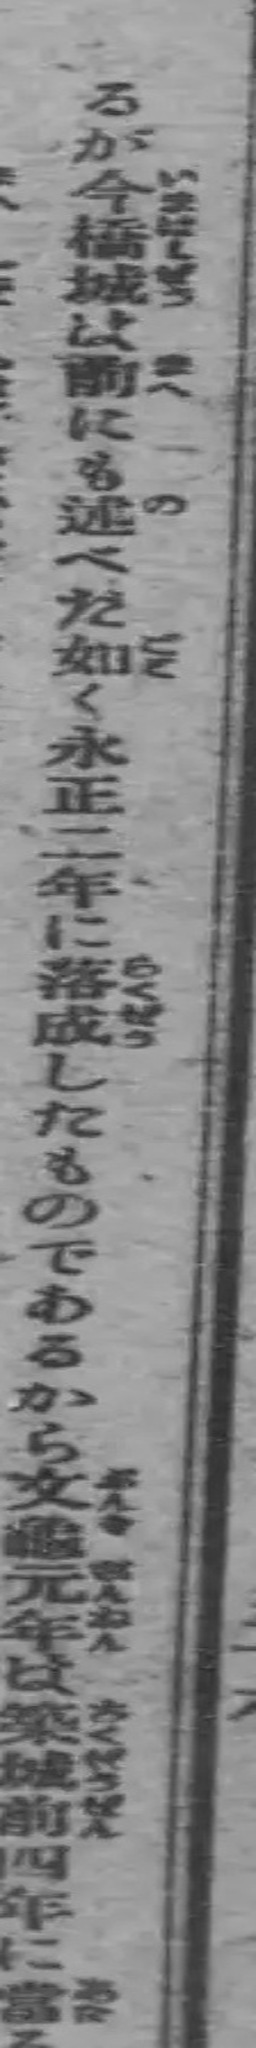るが今橋城は前にも述べた如く永正二年に落城したものであるから文亀元年は築城前四年に当る
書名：豊橋市史談
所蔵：国立国会図書館 National Diet Library, JAPAN
